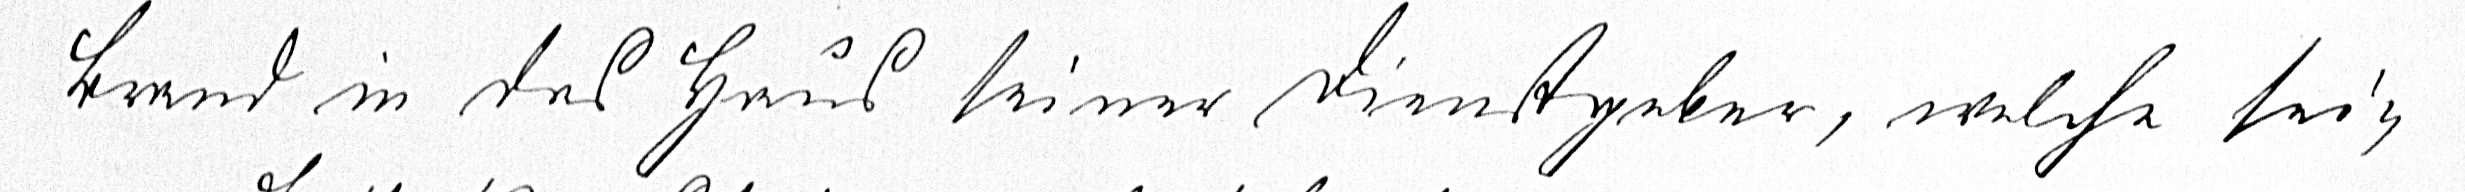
Brand in das Haus seiner Dienstgeber, welche sei¬
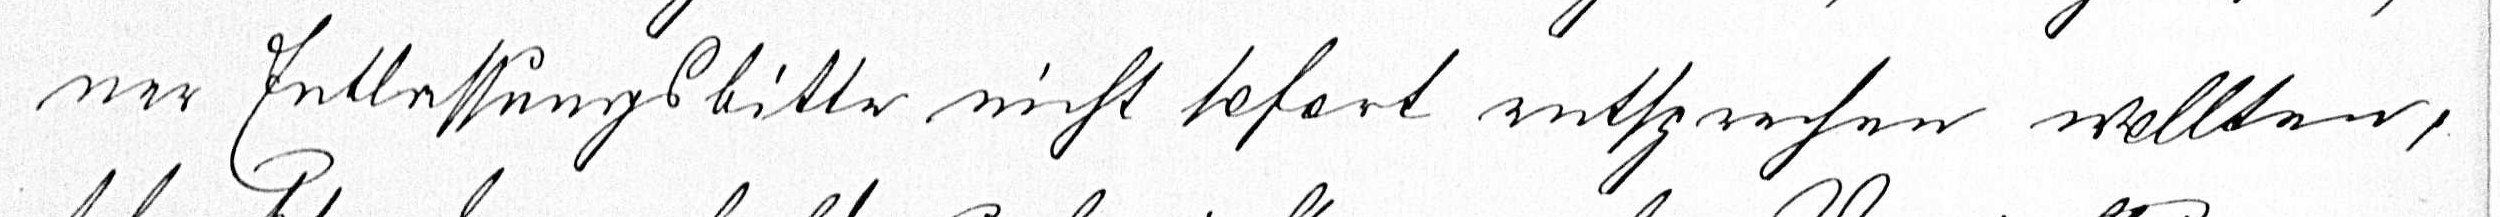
ner Entlassungsbitte nicht sofort entsprechen wollten,
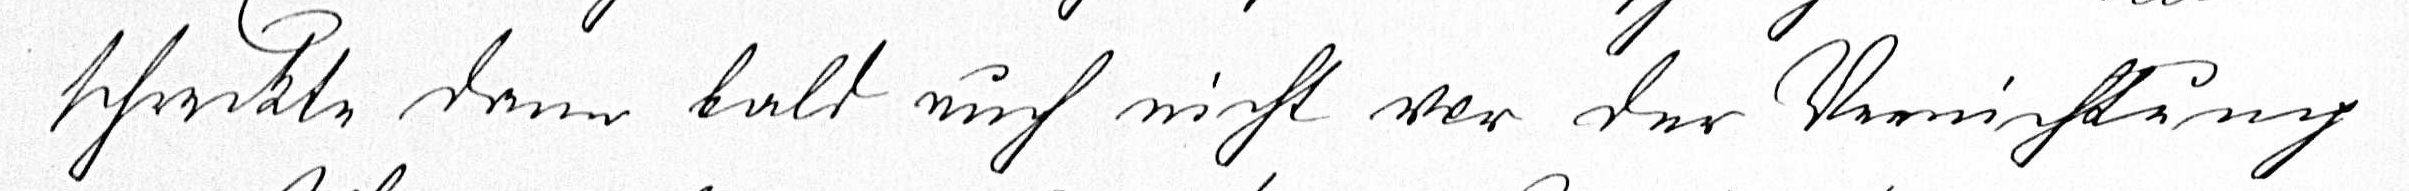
schreckte dann bald auch nicht vor der Vernichtung
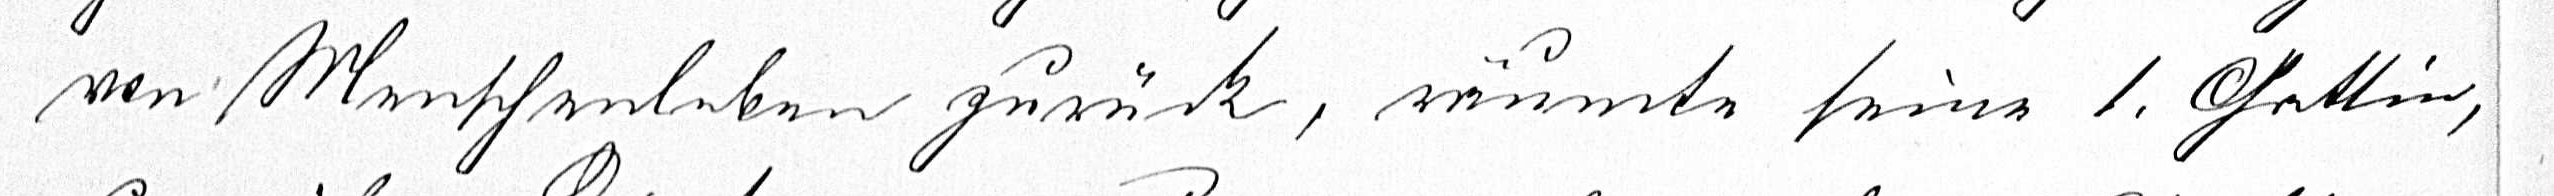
von Menschenleben zurück, räumte seine 1. Gattin,
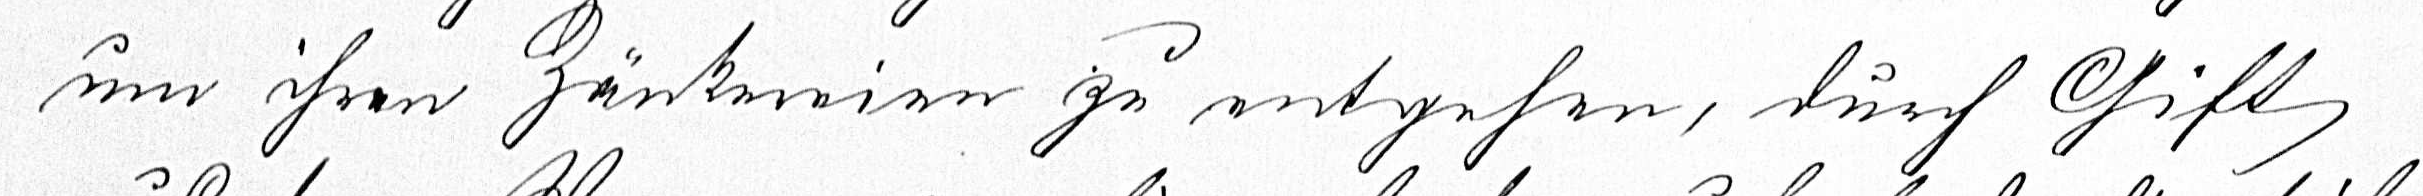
um ihren Zänkereien zu entgehen, durch Gift
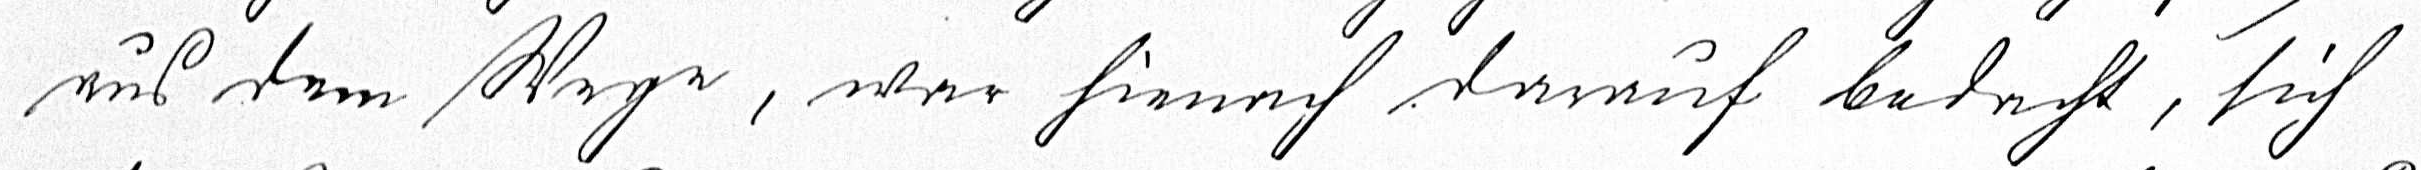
aus dem Wege, war hienach darauf bedacht, sich
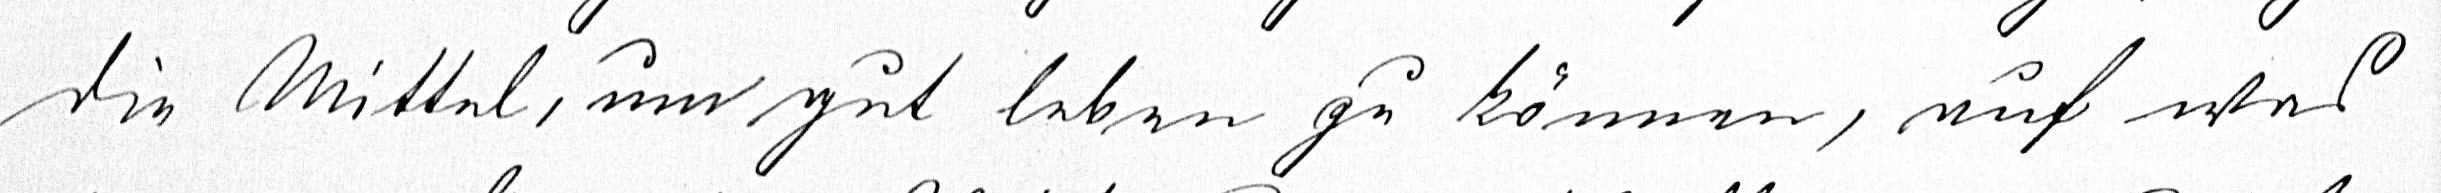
die Mittel, um gut leben zu können, auf was
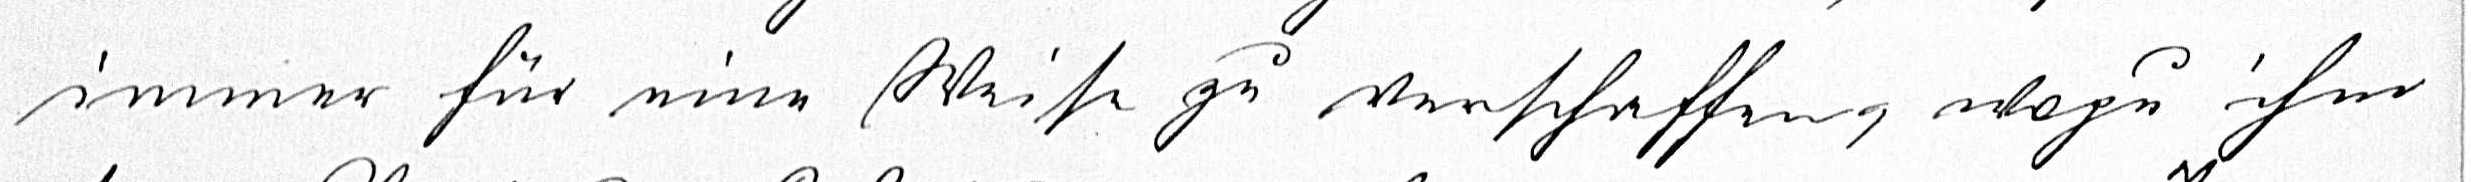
immer für eine Weise zu verschafften, wozu ihm
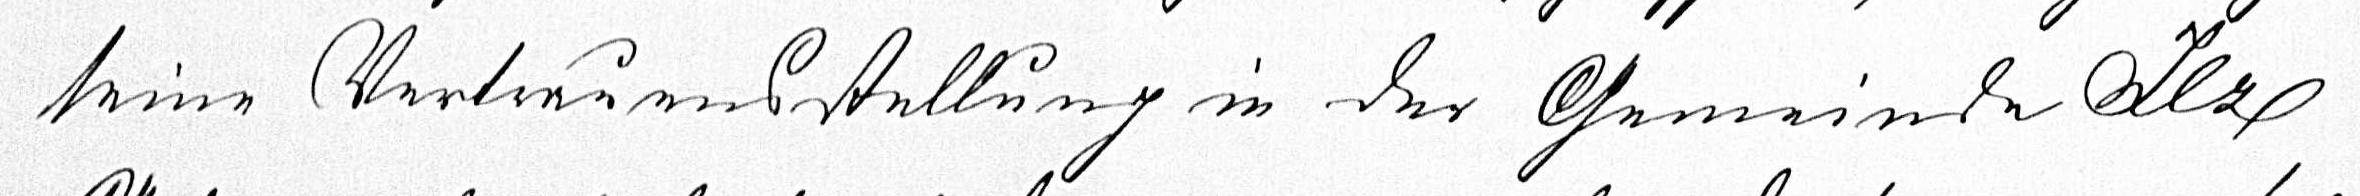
seine Vertrauensstellung in der Gemeinde Jlz
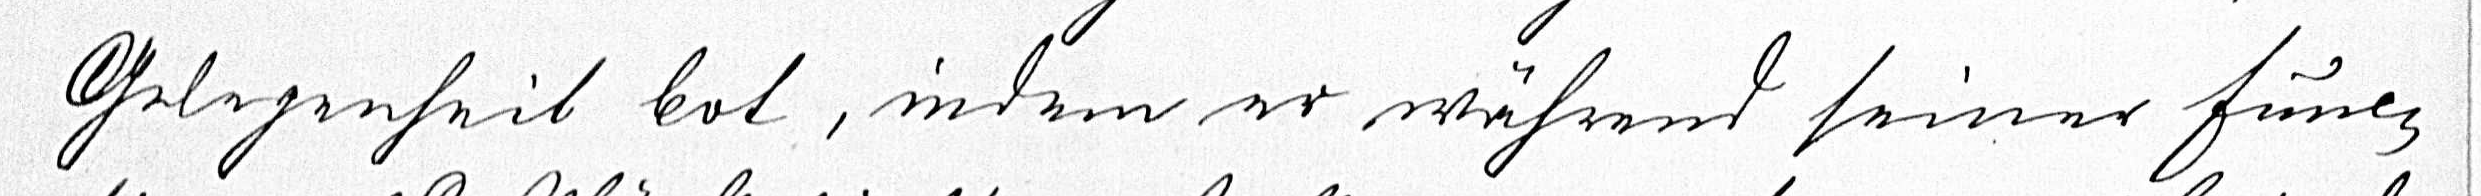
Gelegenheit bot, indem er während seiner func¬
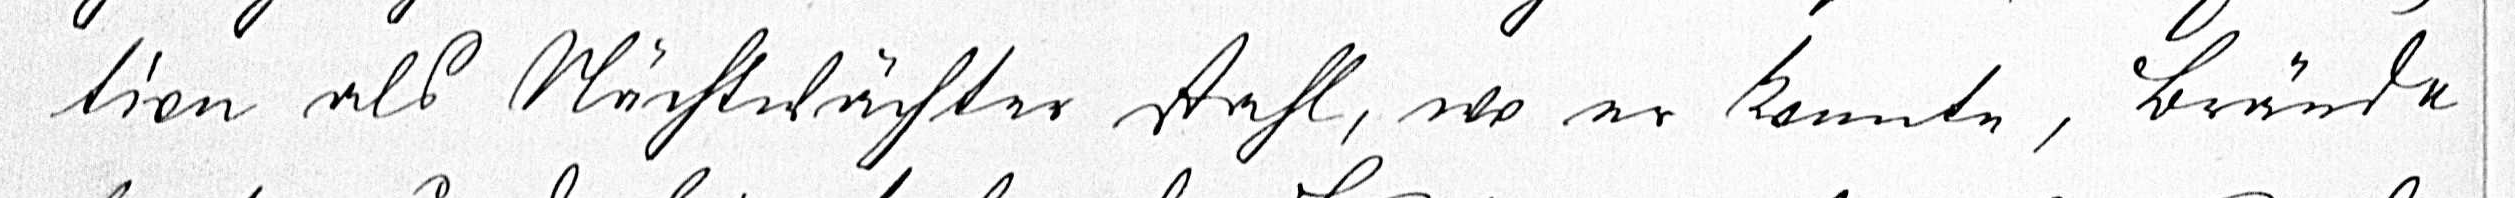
tion als Nächtwächter stahl, wo er konnte, Brände
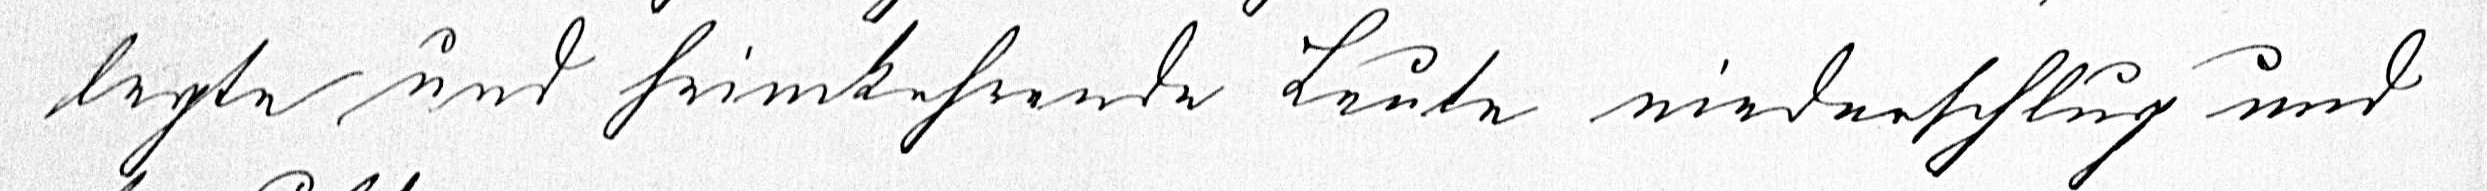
legte und heimkehrende Leute niederschlug und
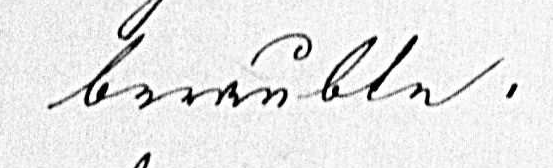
beraubte.
